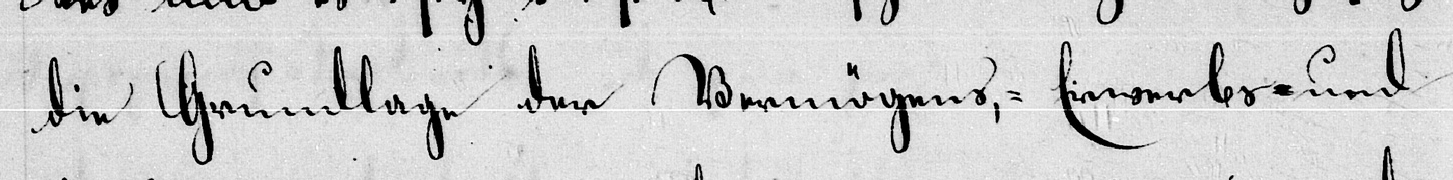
die Grundlage der Vermögens- Erwerbs- und
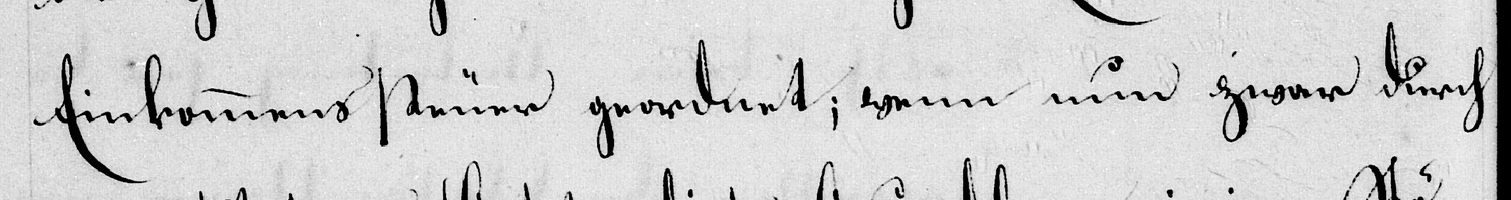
Einkommenssteuer geordnet; wenn nun zwar durch
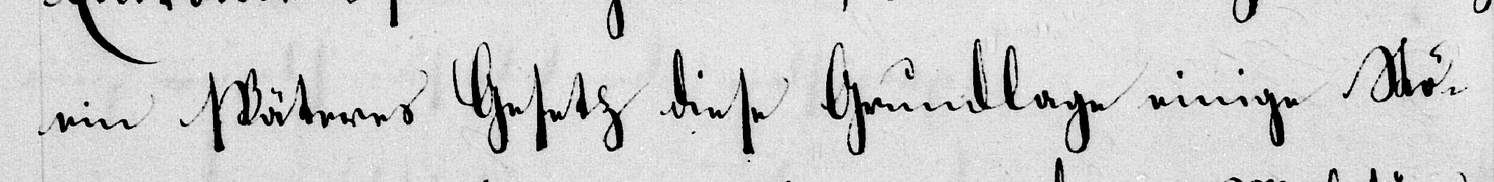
ein späteres Gesetz diese Grundlage einige Stö¬
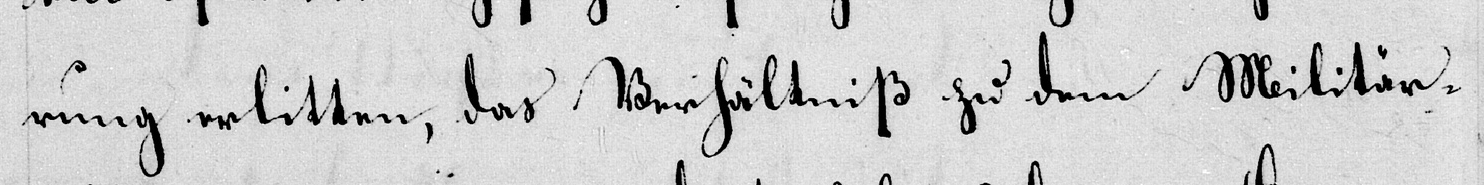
rung erlitten, das Verhältniß zu dem Militär¬
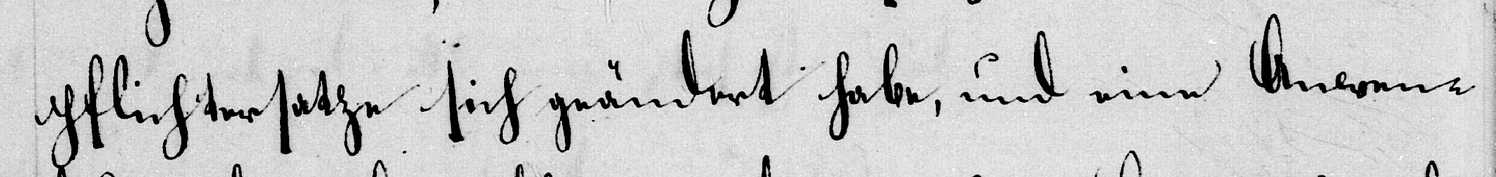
pflichtersatze sich geändert habe, und eine Anwen¬
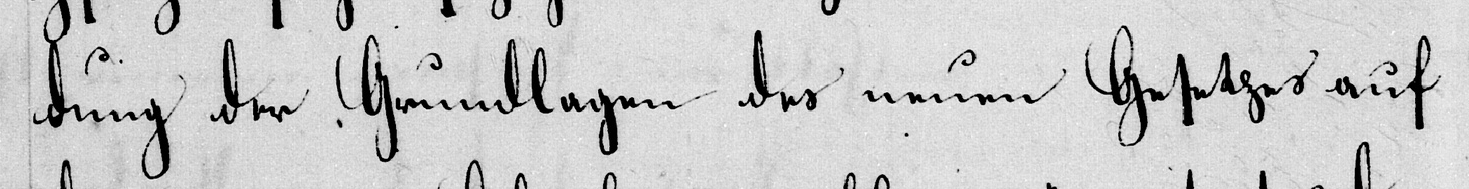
dung der Grundlagen des neuen Gesetzes auf
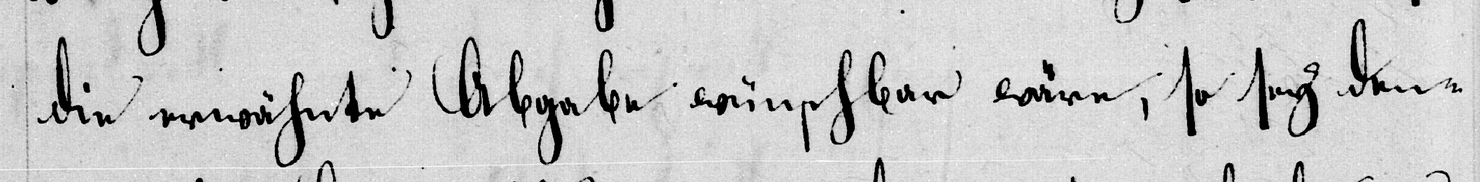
die erwähnte Abgabe wünschbar wäre, so sey den¬
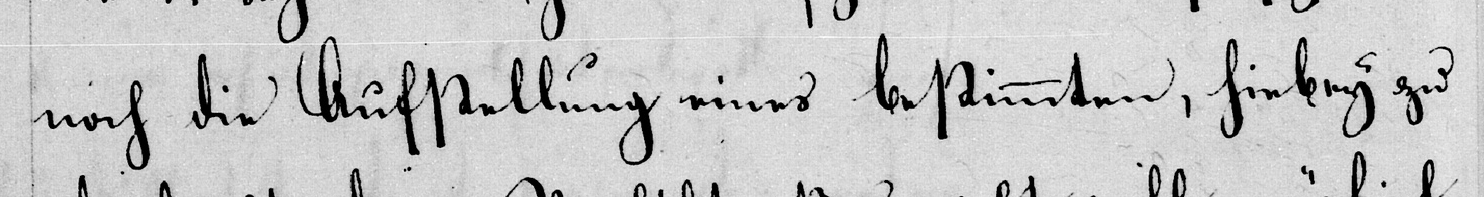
noch die Aufstellung eines bestimmten, hiebey zu
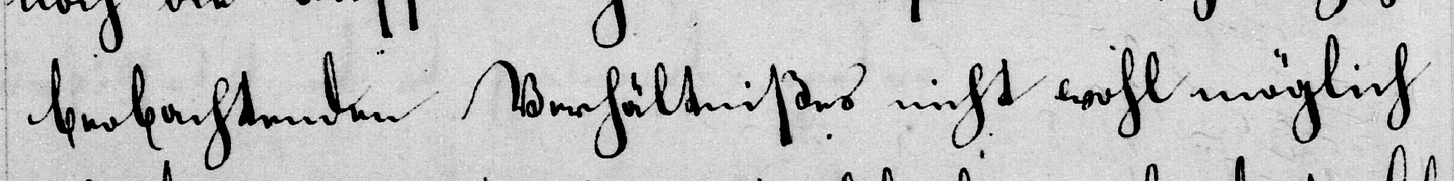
beobachtenden Verhältnißes nicht wohl möglich
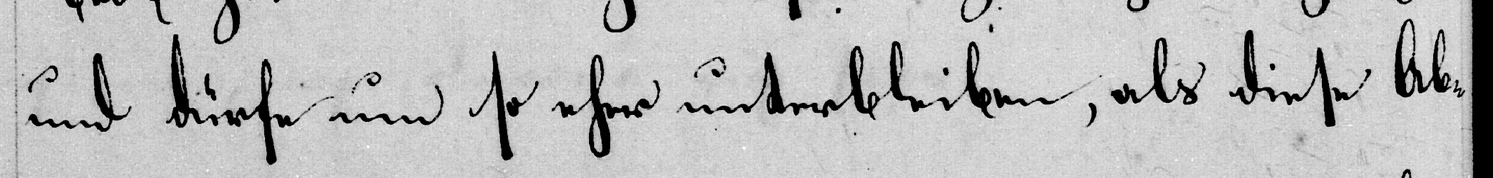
und dürfe um so eher unterbleiben, als diese Ab-
